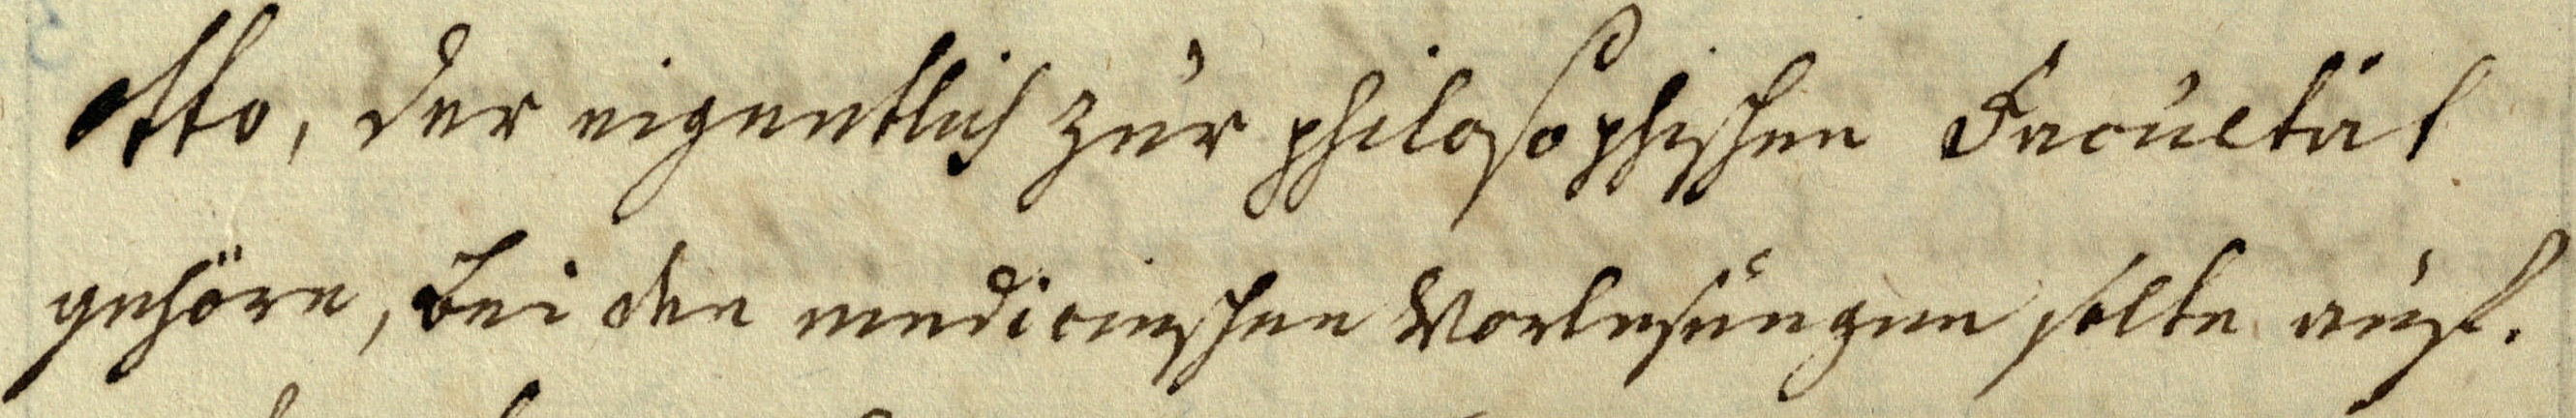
Otto, der eigentlich zur philosophischen Facultät
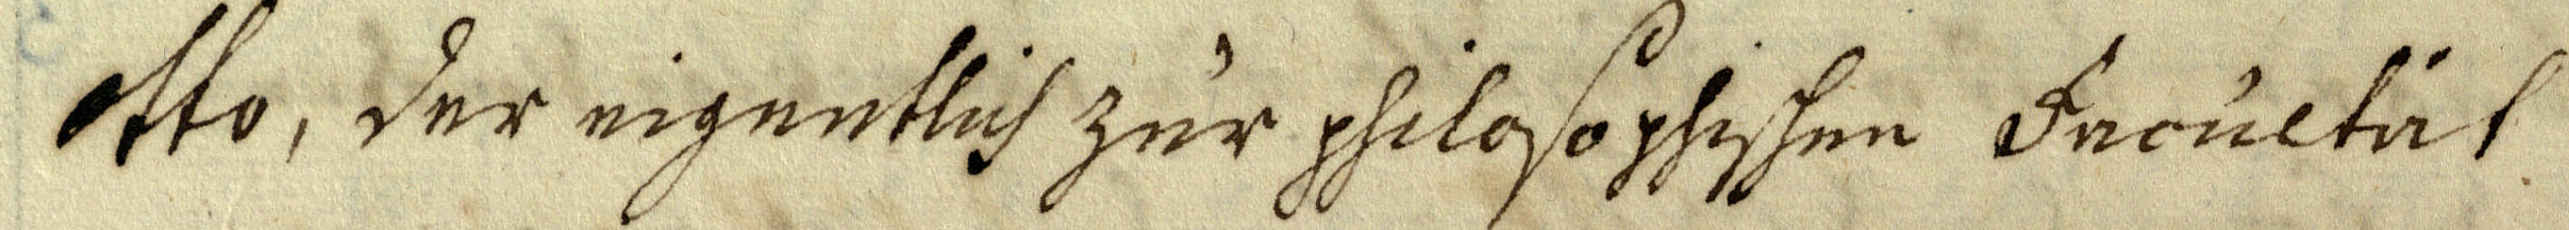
gehöre, bei den medicinischen Vorlesungen solte auf¬
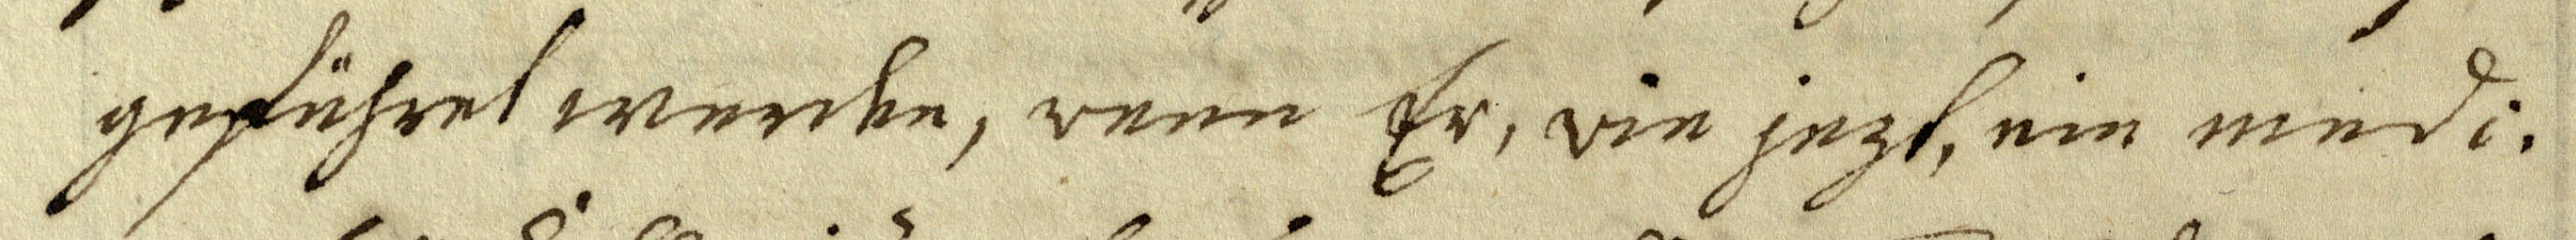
geführet werden, wenn Er, wie jezt, ein medi¬
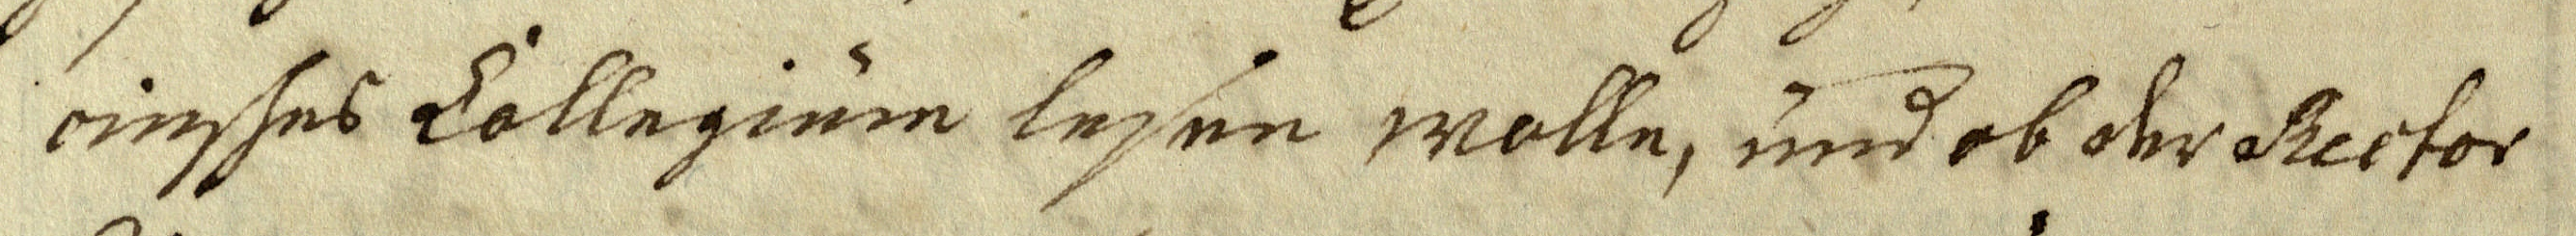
cinsches Collegium lesen wolle, und ob der Rector
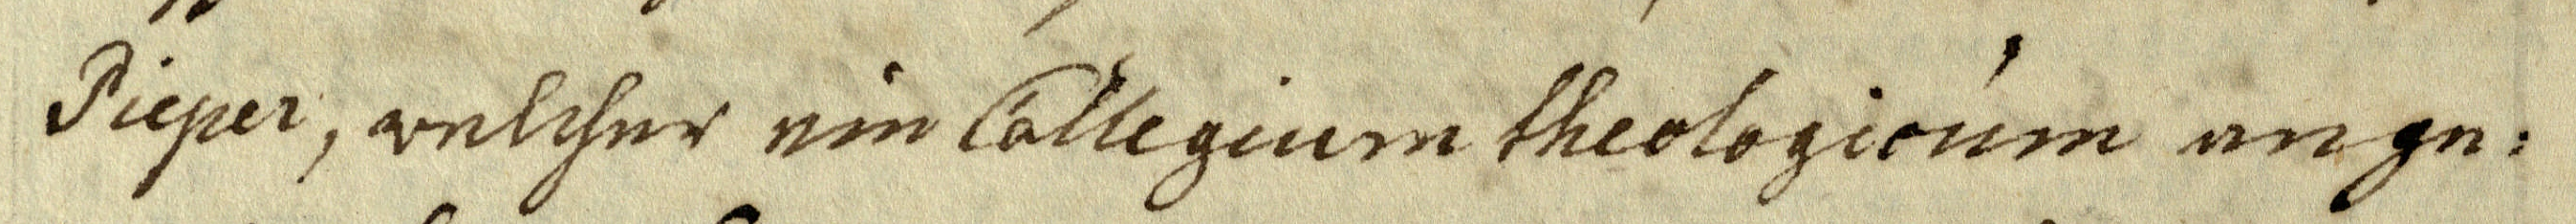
Pieper, welcher ein Collegium theologicum ange¬
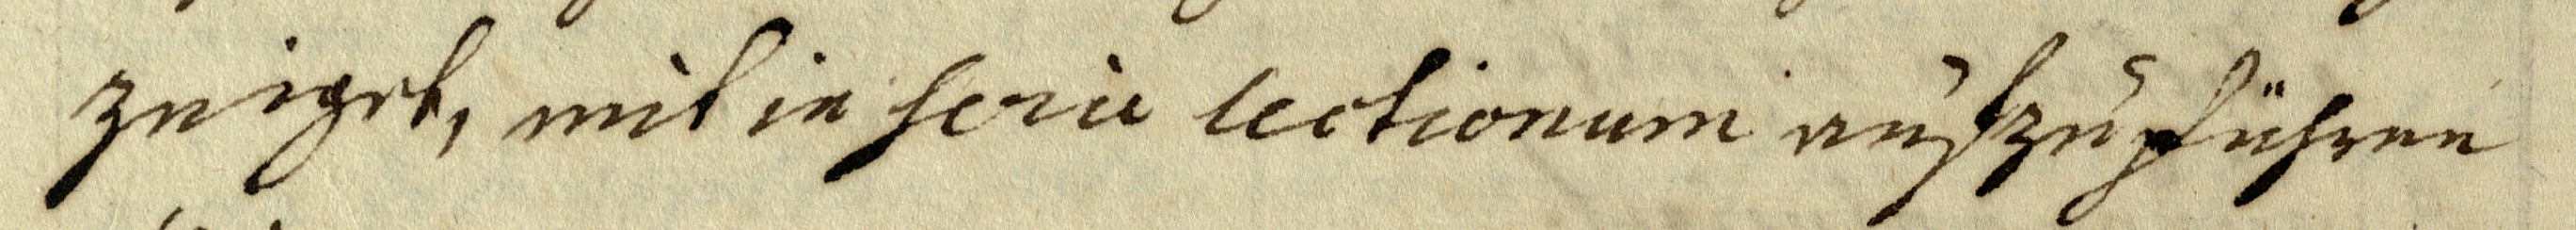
zeiget, mit in serie lectionum aufzuführen
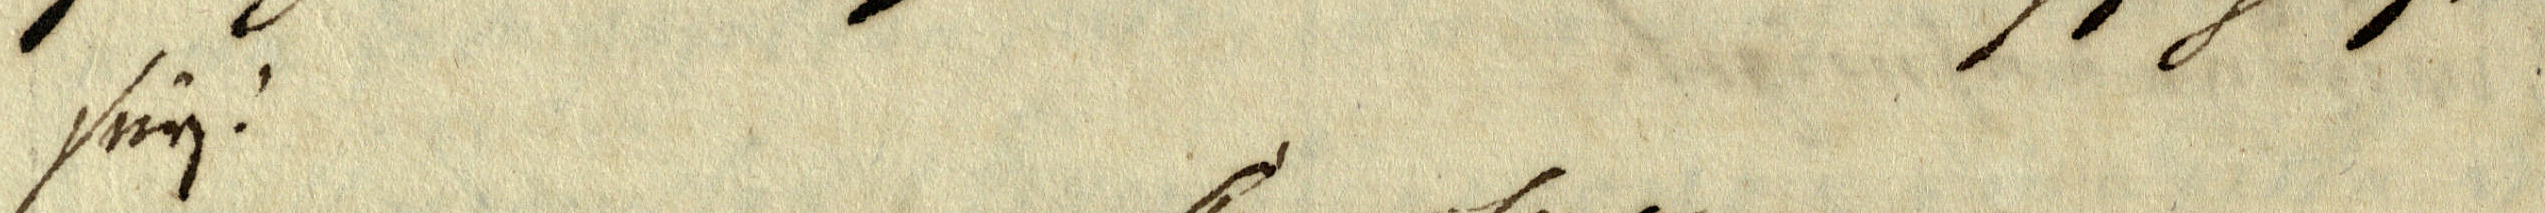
seÿ?
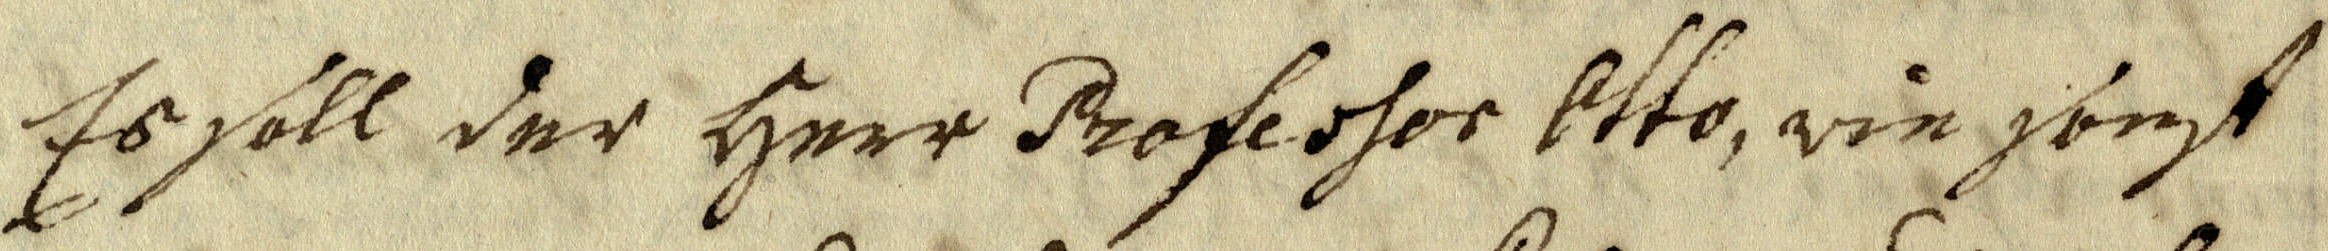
Es soll der Herr Professor Otto, wie sonst
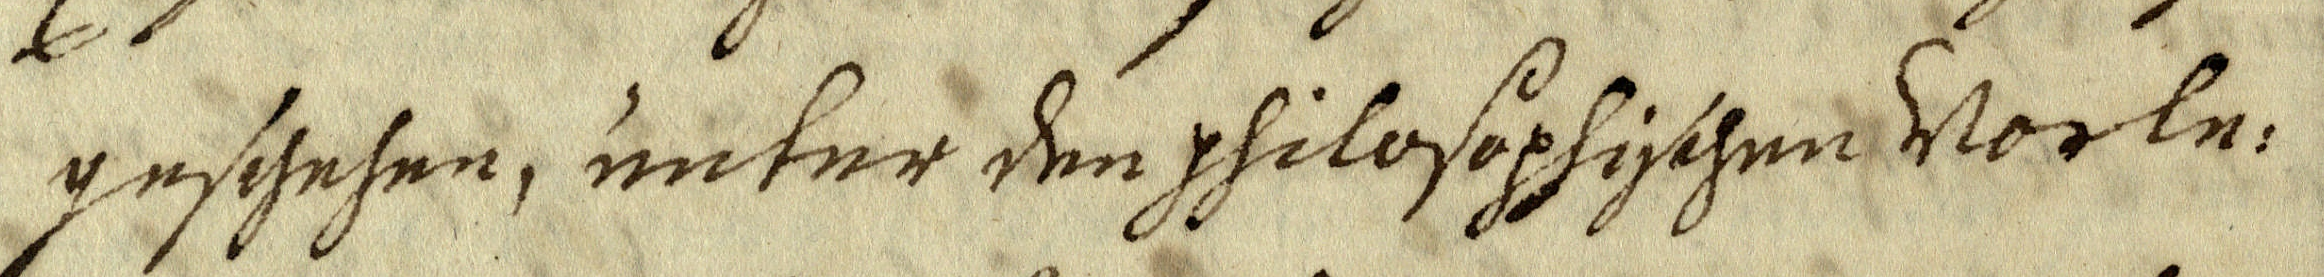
geschehen, unter den philosophischen Vorle¬
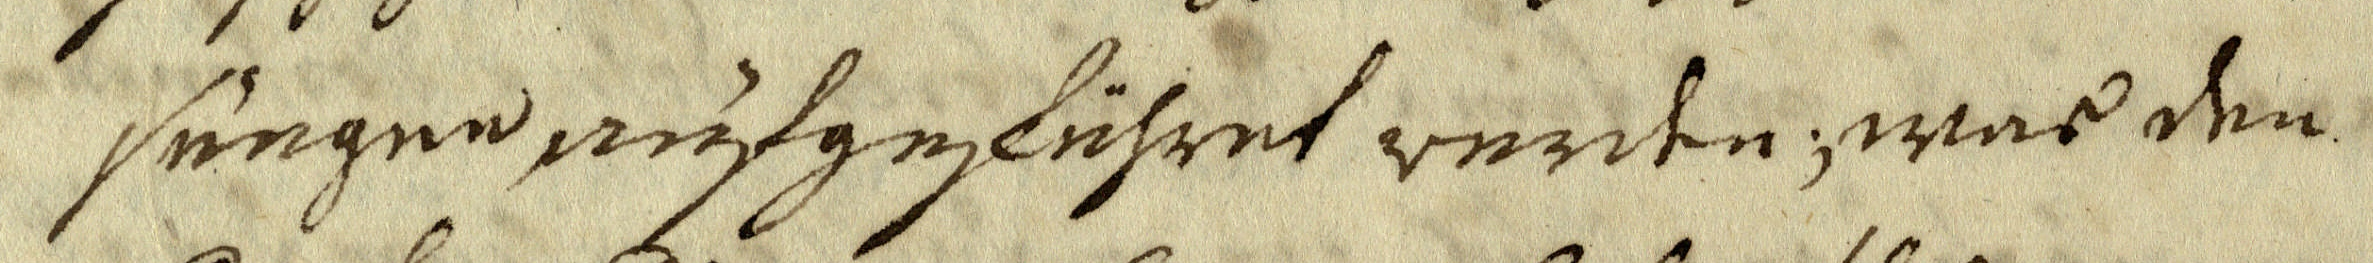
sungen aufgeführet werden; was den
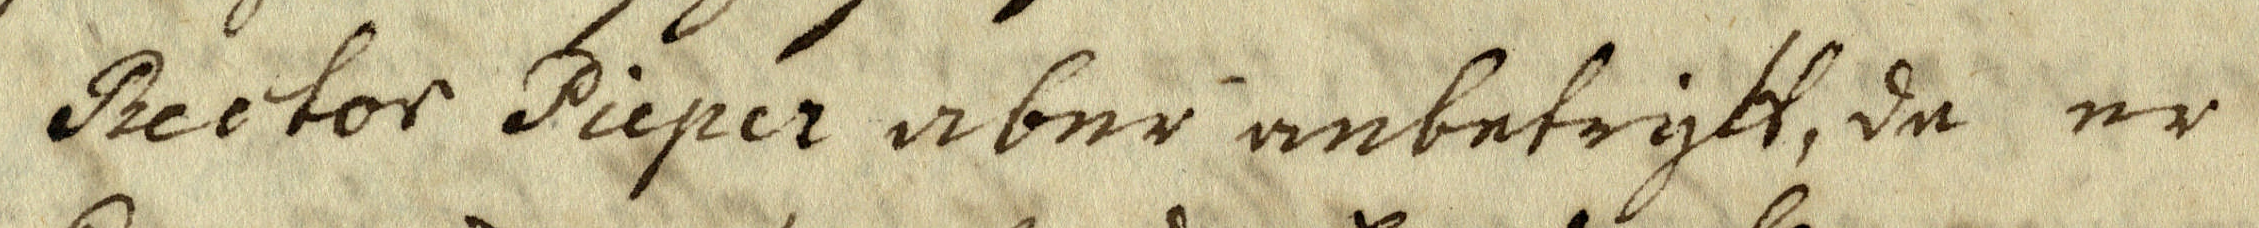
Rector Pieper aber anbetrift, da er
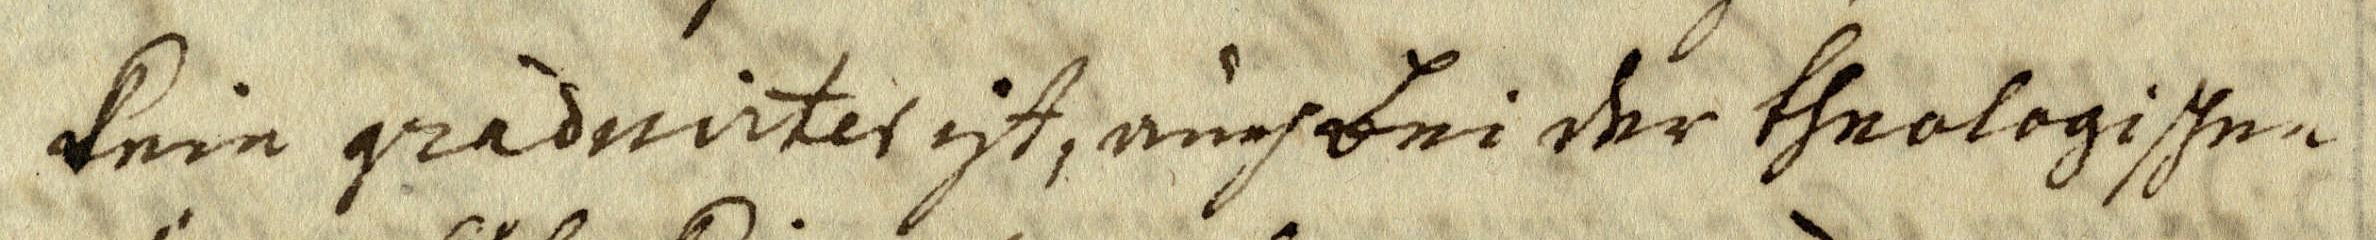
kein graduirter ist, auch bei der theologischen
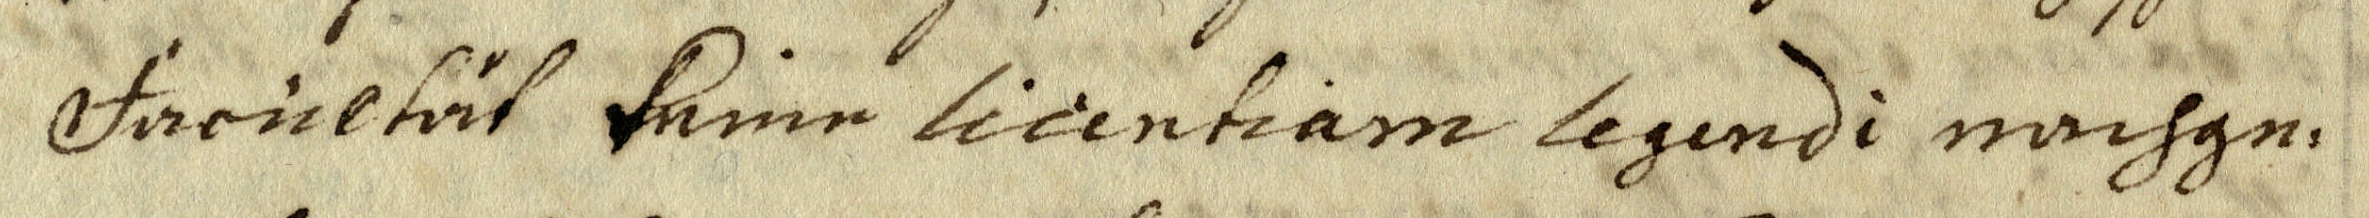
facultät keine licentiam legendi nachge¬
